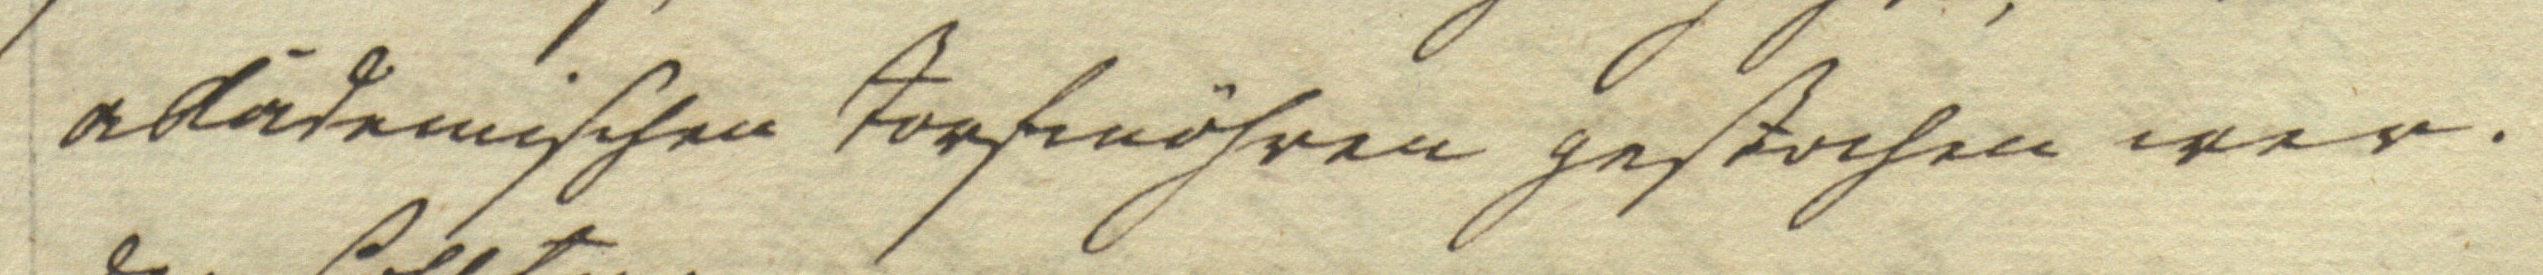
akademischen Torfmöhren gestochen wer¬
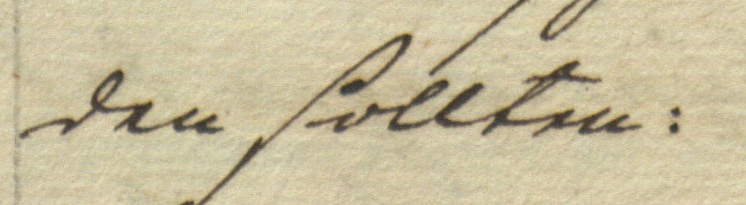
den sollten.
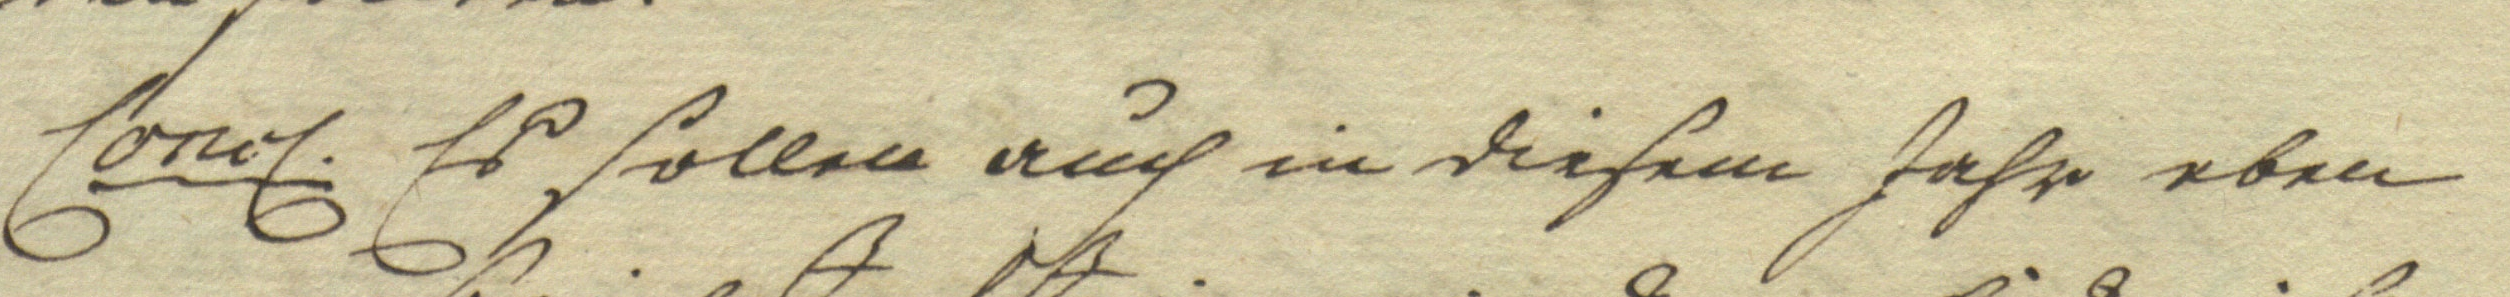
Concl. Es sollen auch in diesem Jahr eben
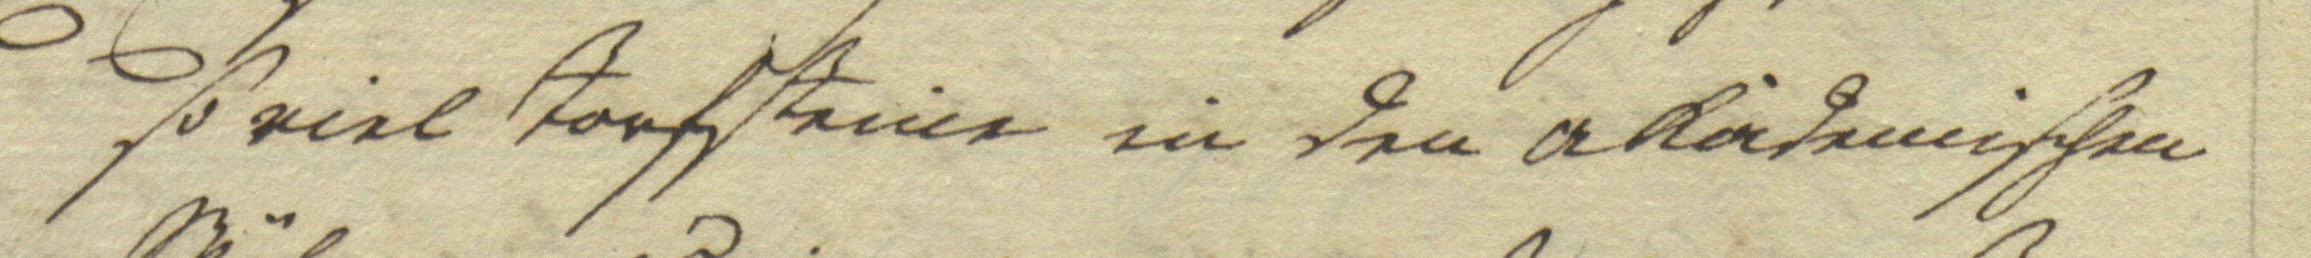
so viel Torfsteine in den akademischen
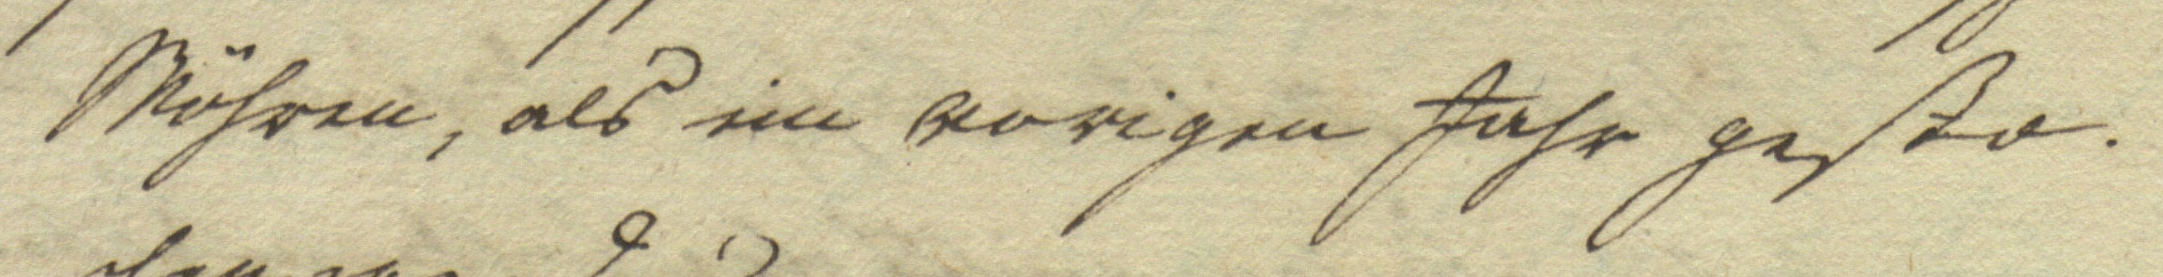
Möhren, als im vorigen Jahr gesto¬
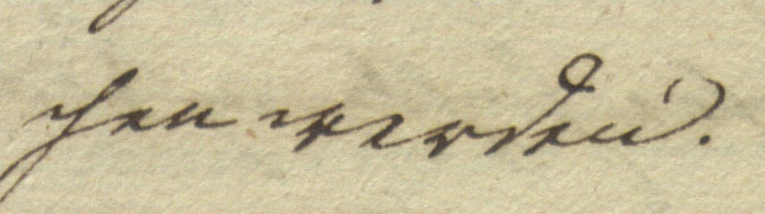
chen werden.
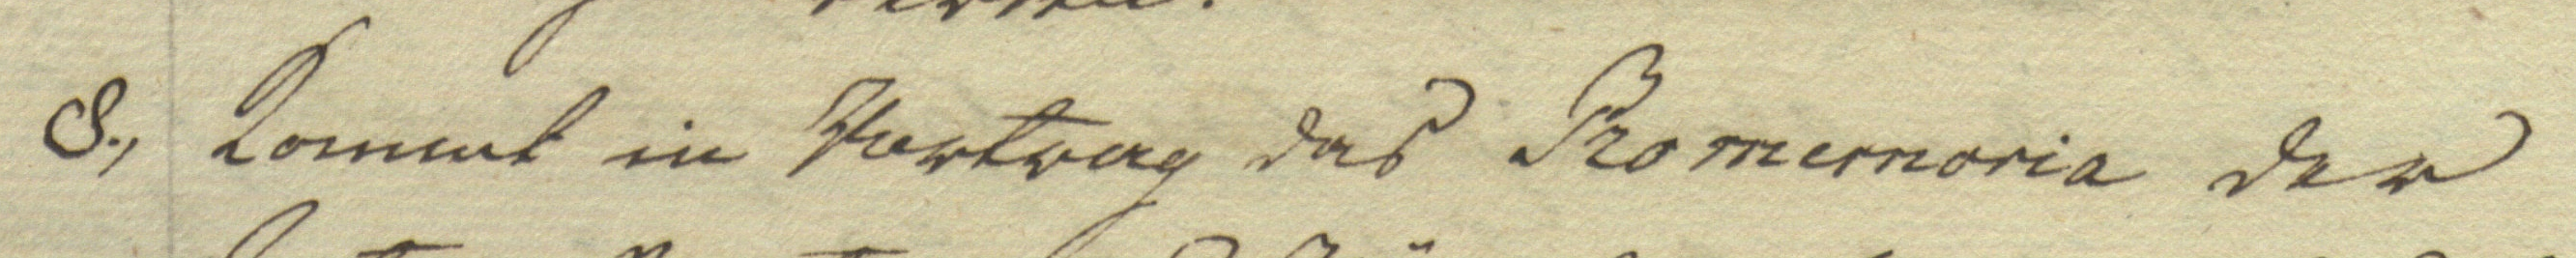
8., Kommt in Vortrag das Promemoria der
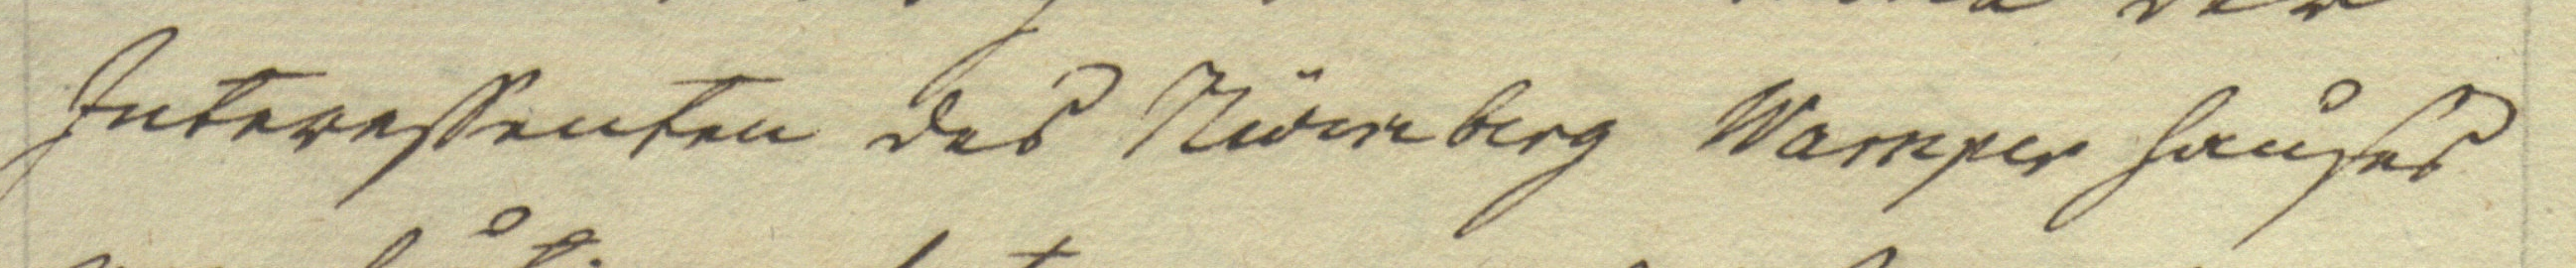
Interessenten des Nürnberg Wamper Hauses
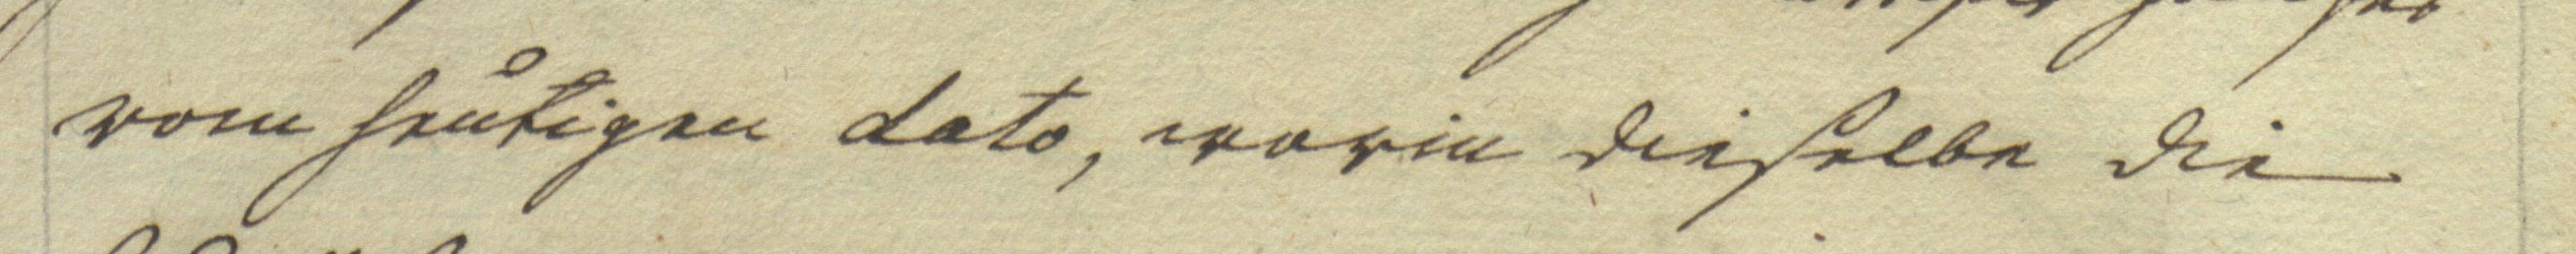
vom heutigen dato, worin dieselbe die
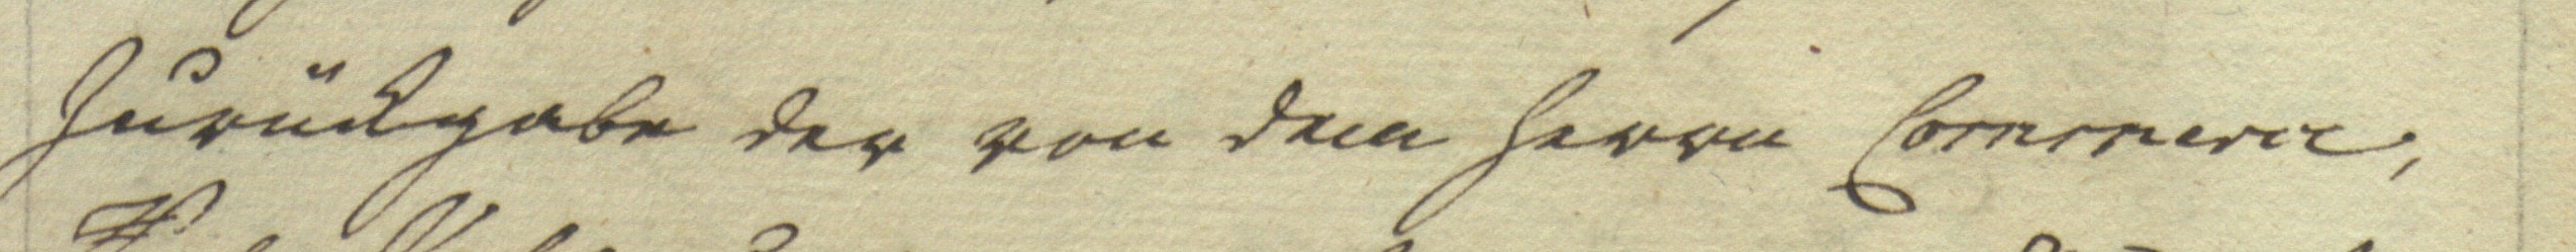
Zurükgabe der von dem Herrn Commerce.
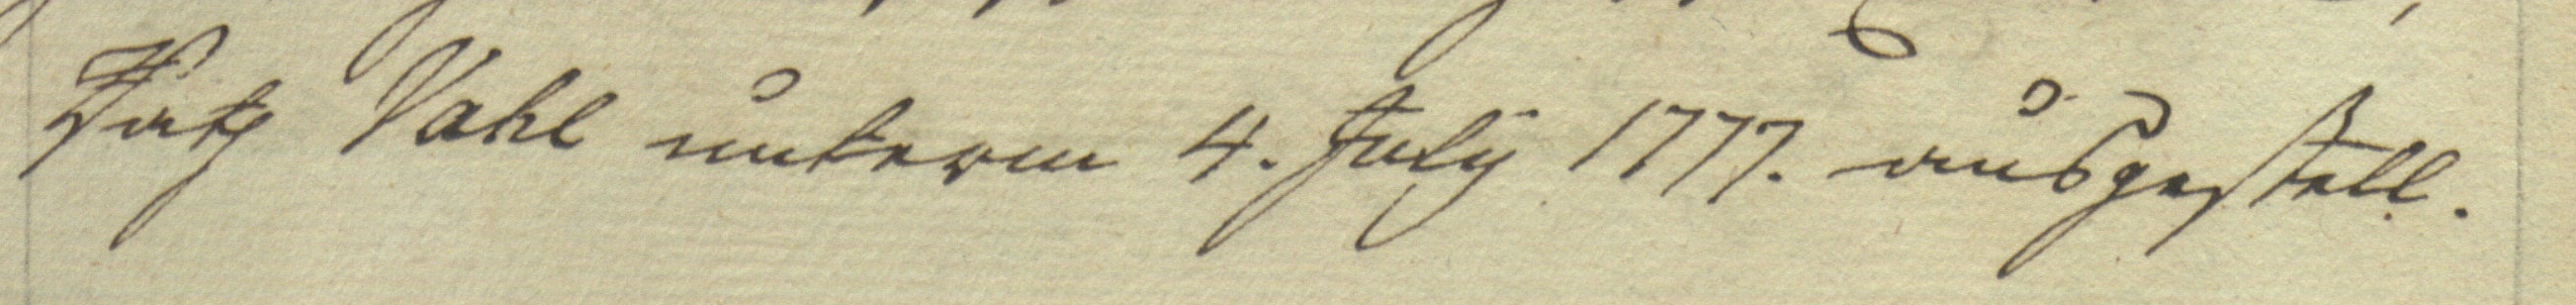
Rath Vahl unterm 4. Julÿ 1777. ausgestell¬
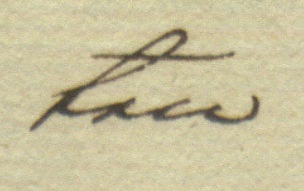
ten
